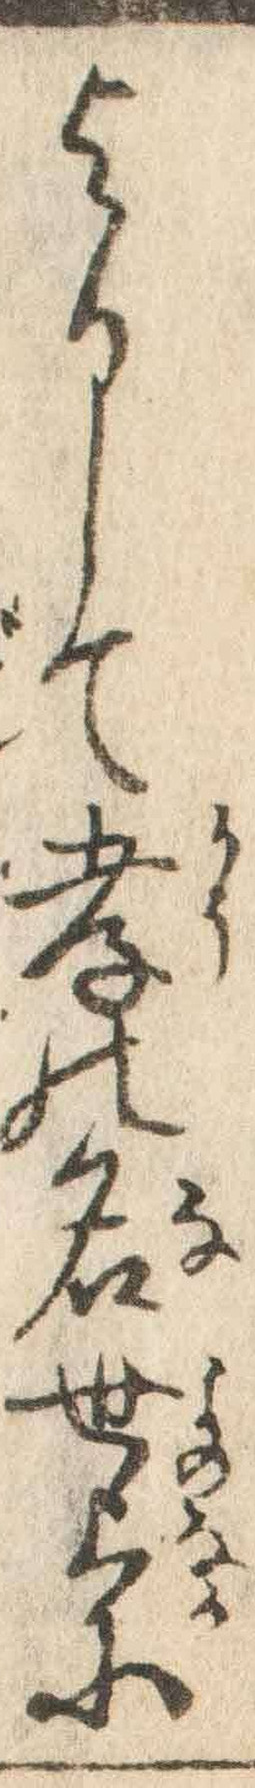よりして孝の名世上に
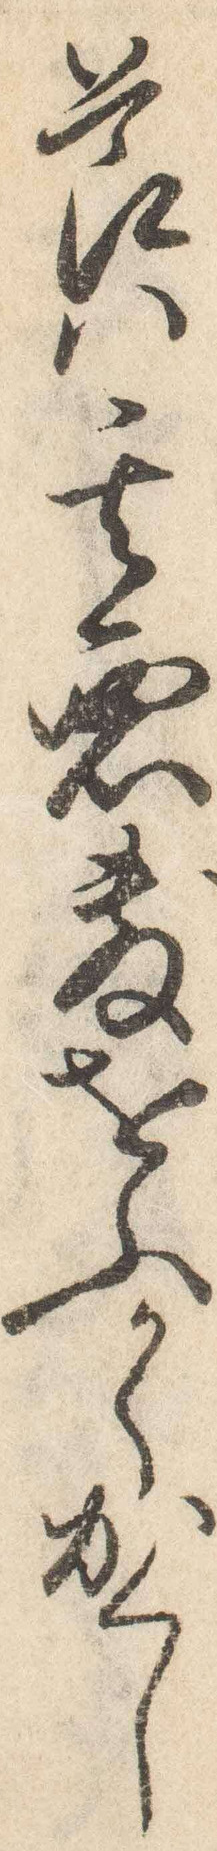節は其悪敷をふかくかくし
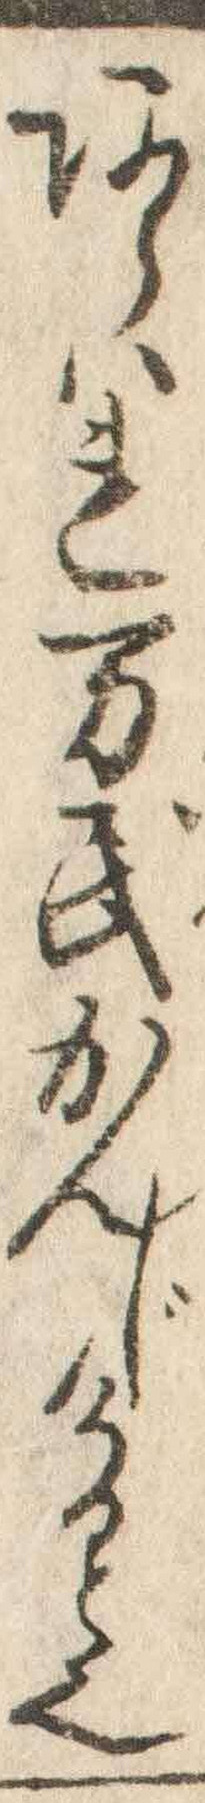あらはれ万民かんじけると也
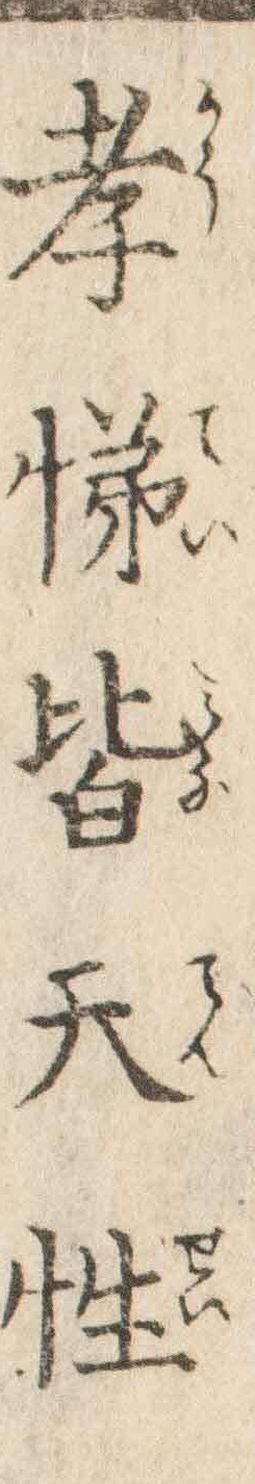孝悌皆天性
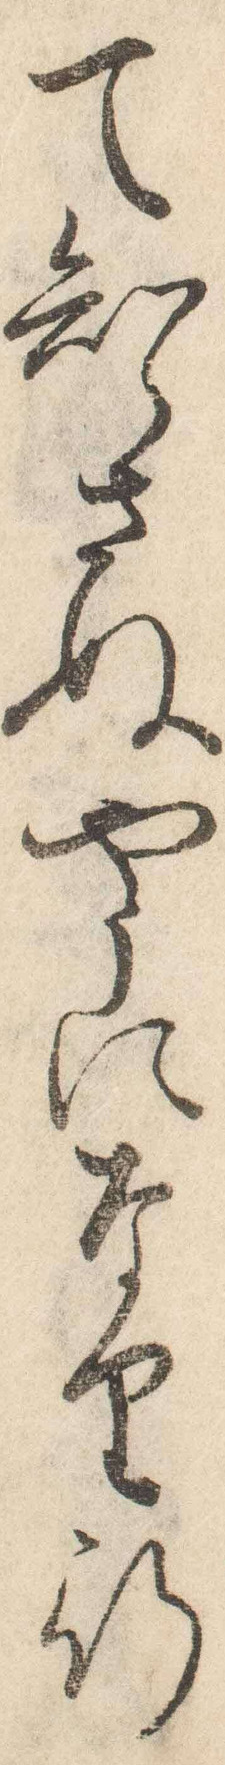て知らさぬやうになり行
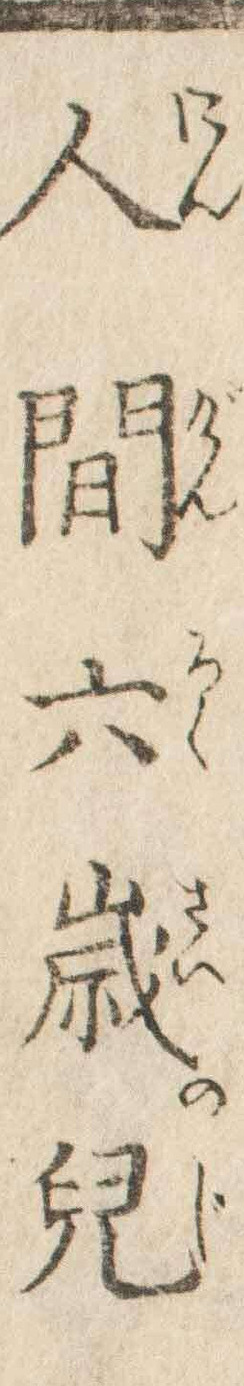人間六歳児
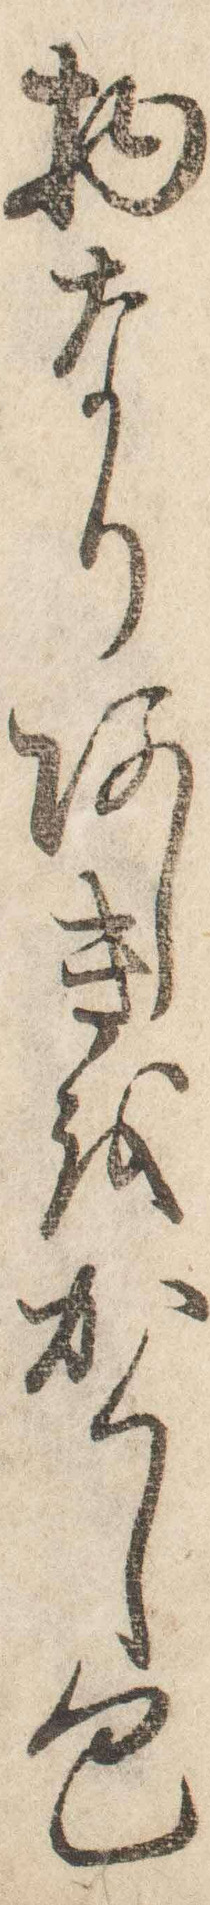物なりあしきをかく包
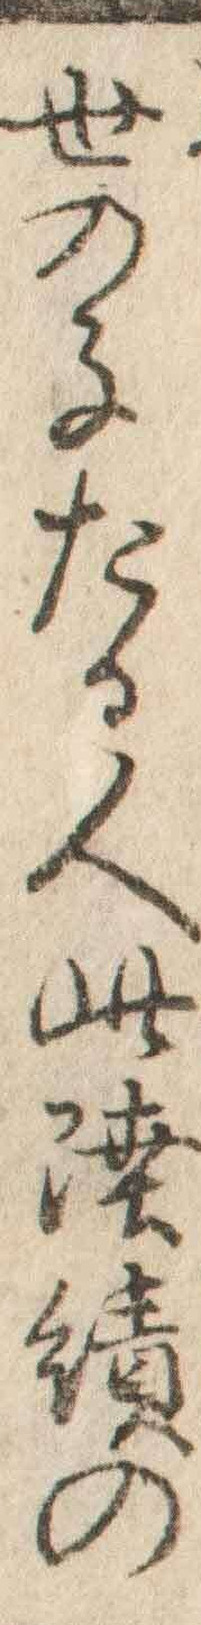世の子たる人此陸績の
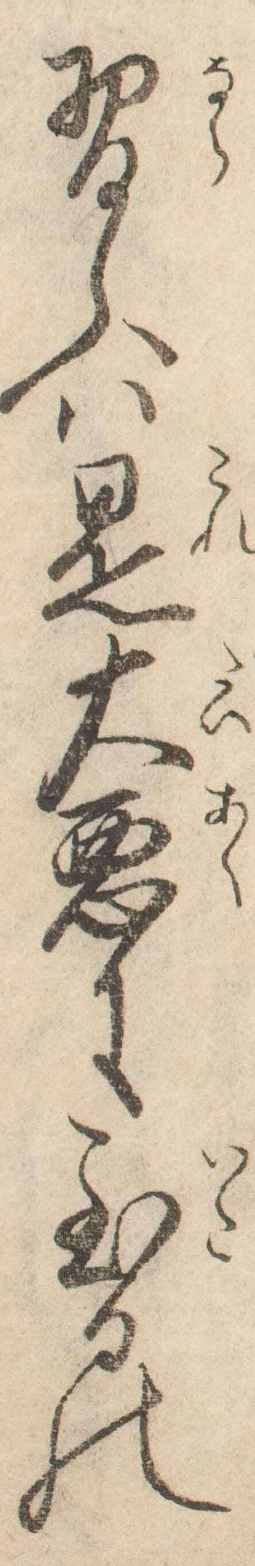習ふは是大悪に至るの

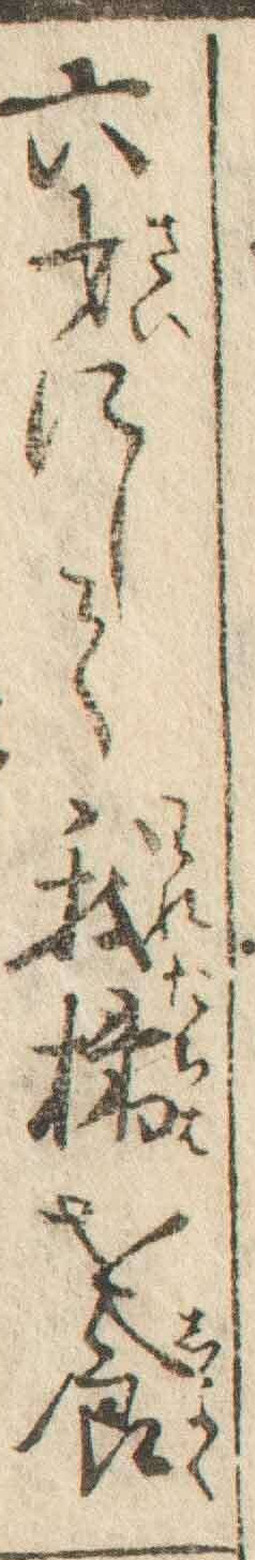六才にして我橘を食
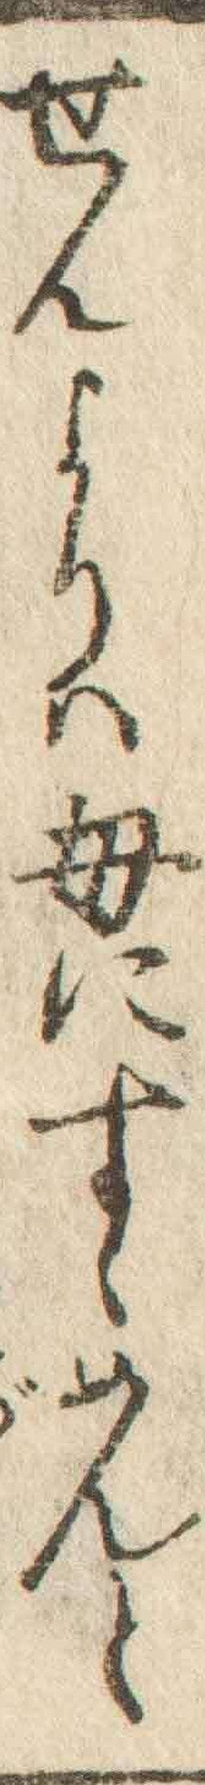せんよりは母にすゝめんと
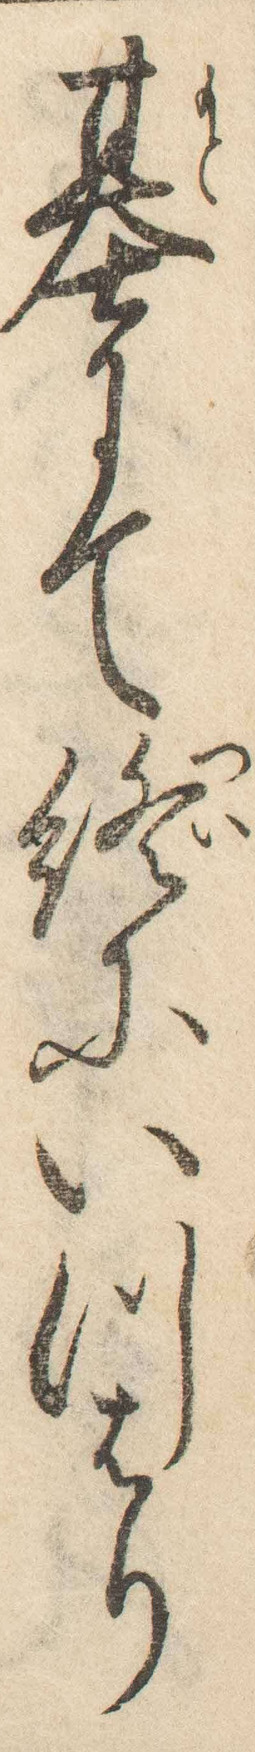基にて終にいつはり
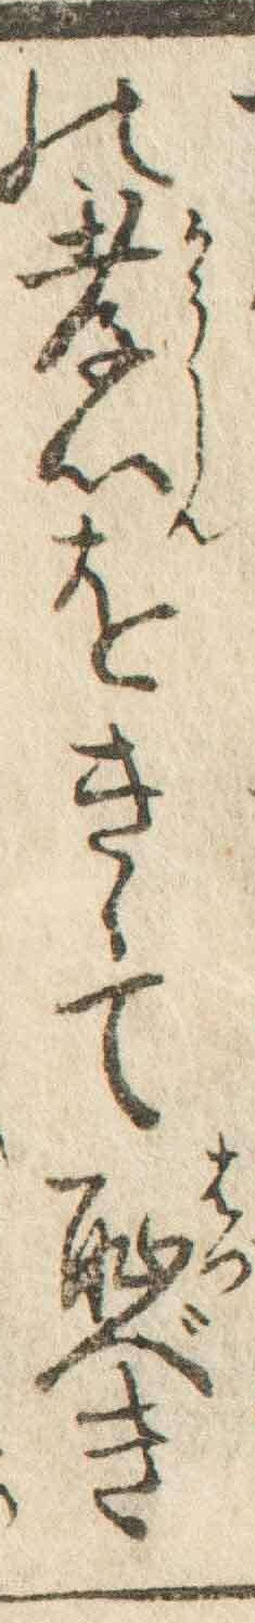の孝心をきゝて恥べき
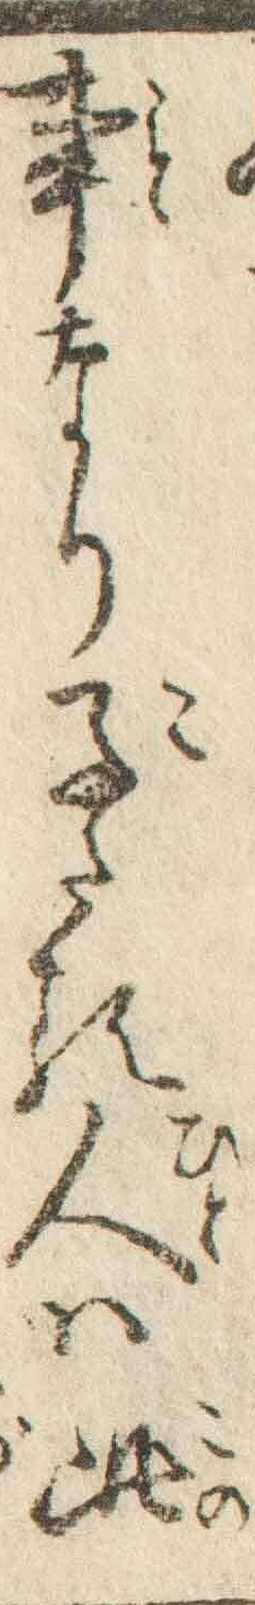事なり子たる人は此
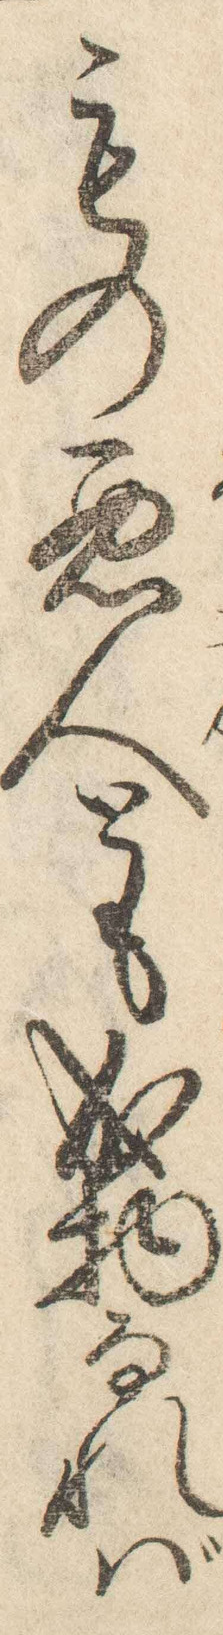もの悪人とも成物なれば
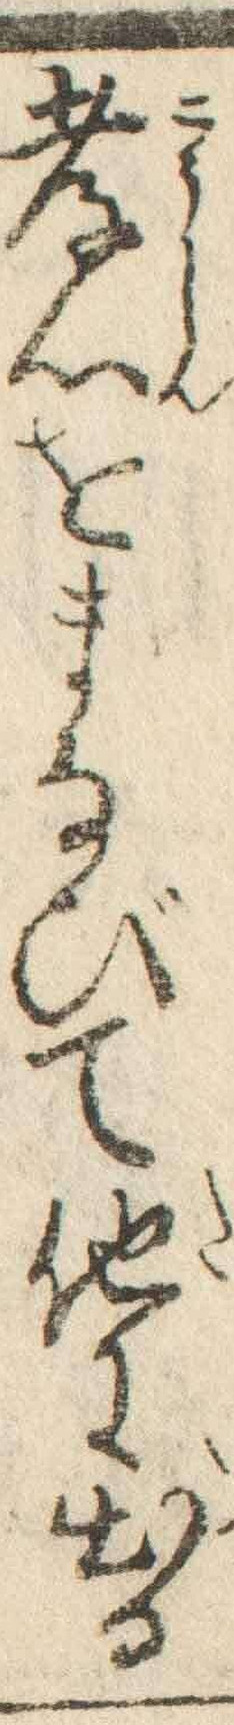孝心をまなびて他に出る
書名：撫育草
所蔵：東京学芸大学附属図書館 国文学研究資料館
